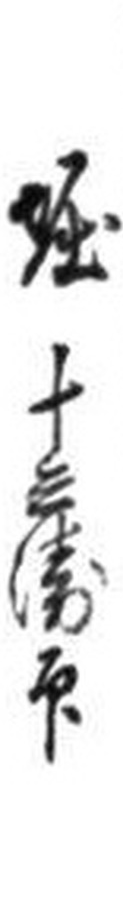堀十兵衛印
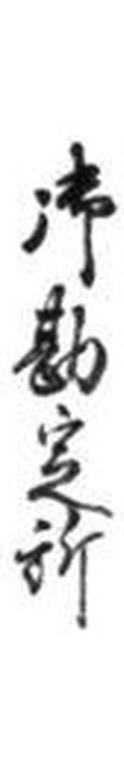御勘定所
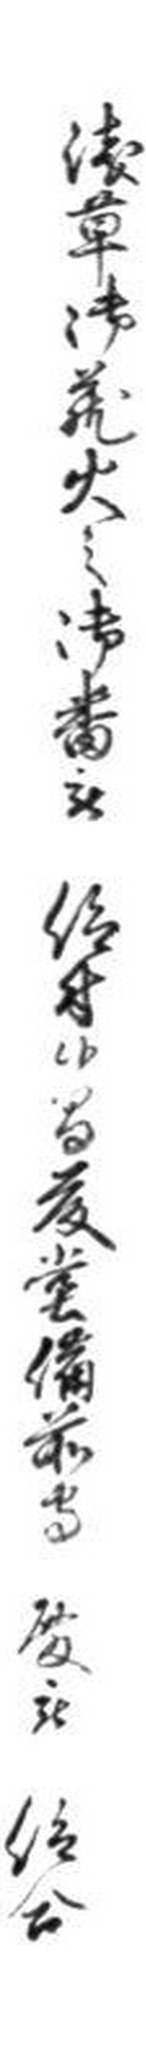浅草御蔵火之御番被仰付候間藤堂備前守殿被仰合
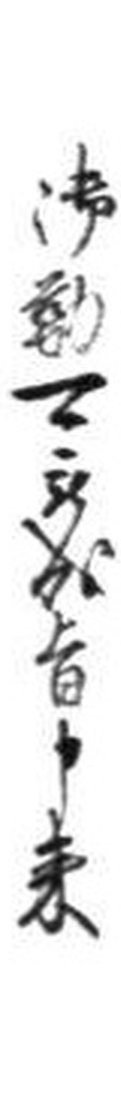御勤可被成旨申来
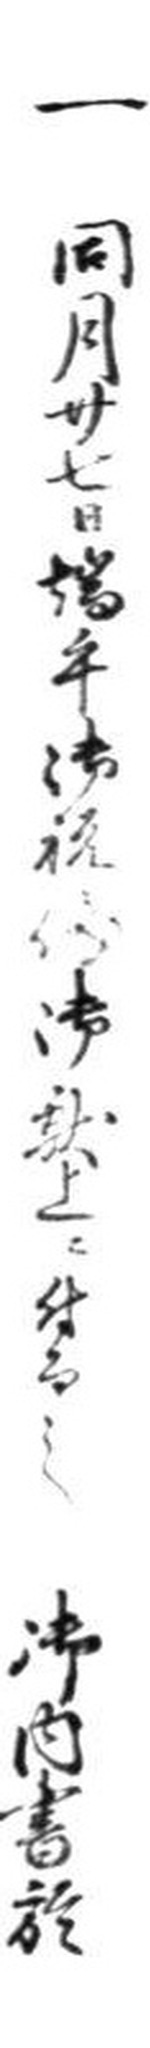一同月廿七日端午御祝儀御献上ニ付而之御内書於
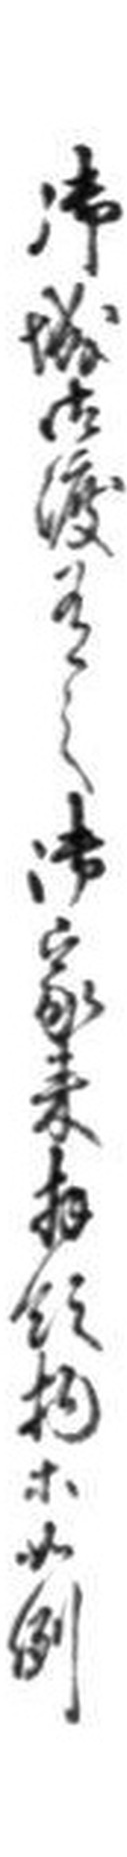御城御渡有之御家来拝領物等如例
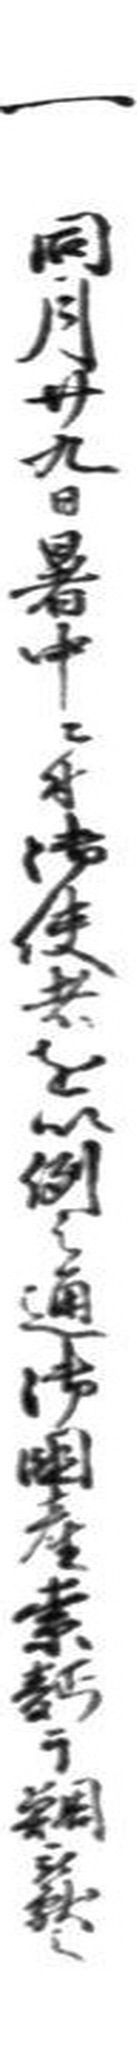一同月廿九日暑中ニ付御使者を以例之通御国産素麺干鯛被献之
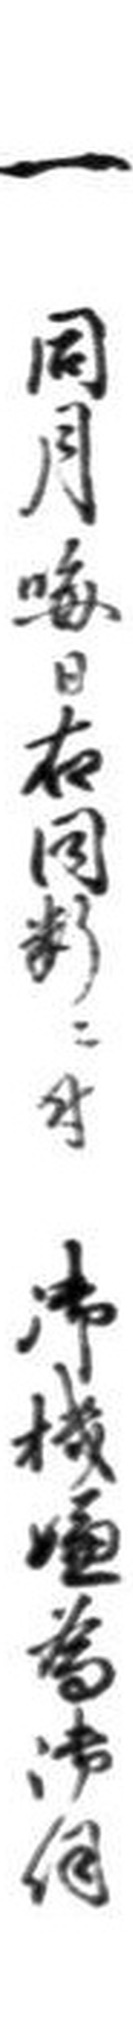一同月晦日右同断ニ付御機嫌為御伺
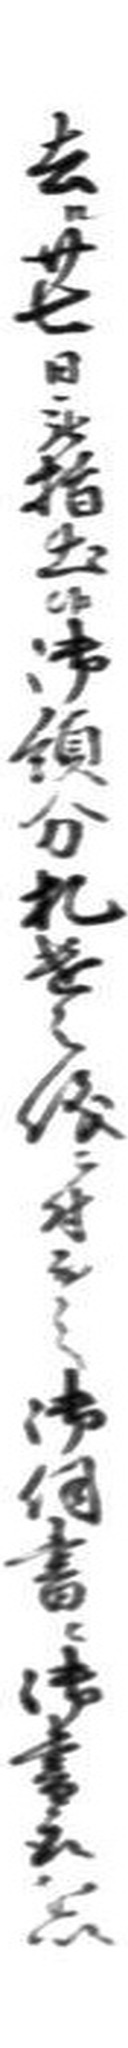去ル廿七日被指出候御領分札遣之儀ニ付而之御伺書ニ御書取を以
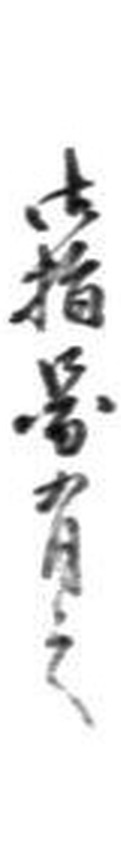御指図有之
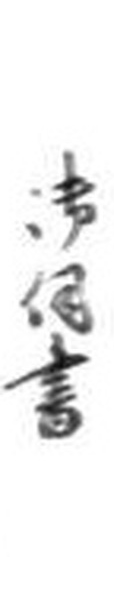御伺書
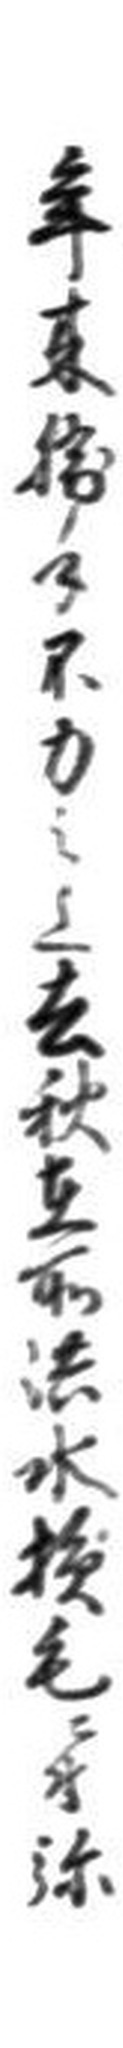年来勝手不力之上去秋在所洪水損毛ニ付弥
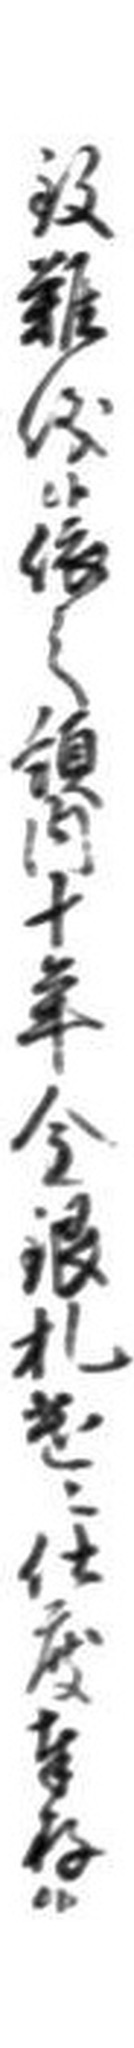致難儀候依之領内十年金銀札遣ニ仕度奉存候

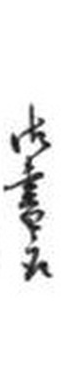御書取
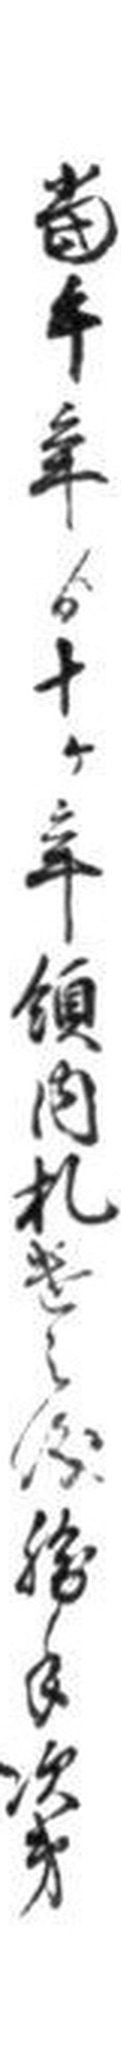当午年ゟ十ケ年領内札遣之儀勝手次第
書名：家譜 二十二 吉品公 従元禄十五年到同十六年
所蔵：福井県文書館 Fukui Prefectural Archives
